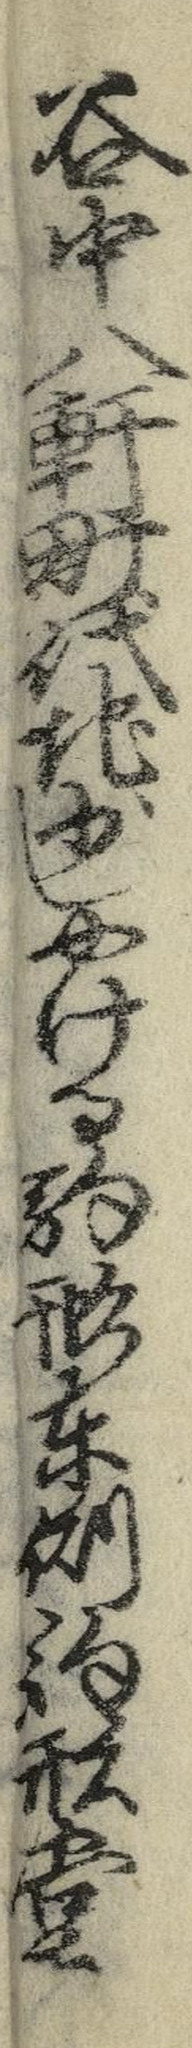谷中八軒町代地少しやける駒形東側駒形堂
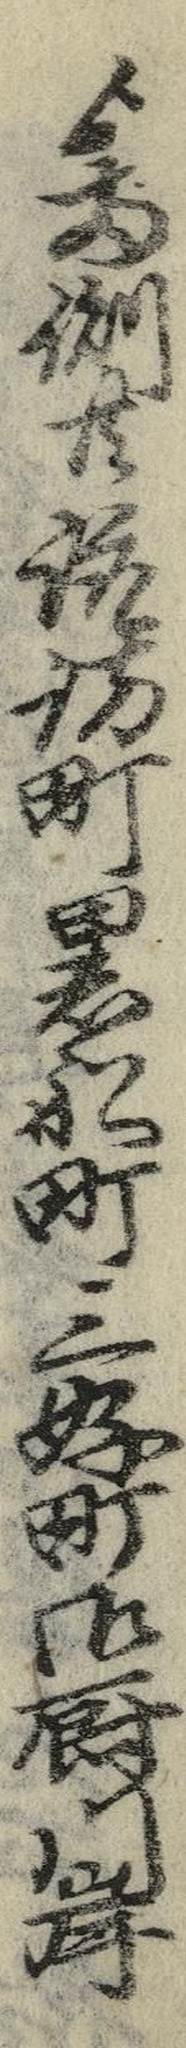ゟ両側共諏訪町黒船町三好町御厩川岸
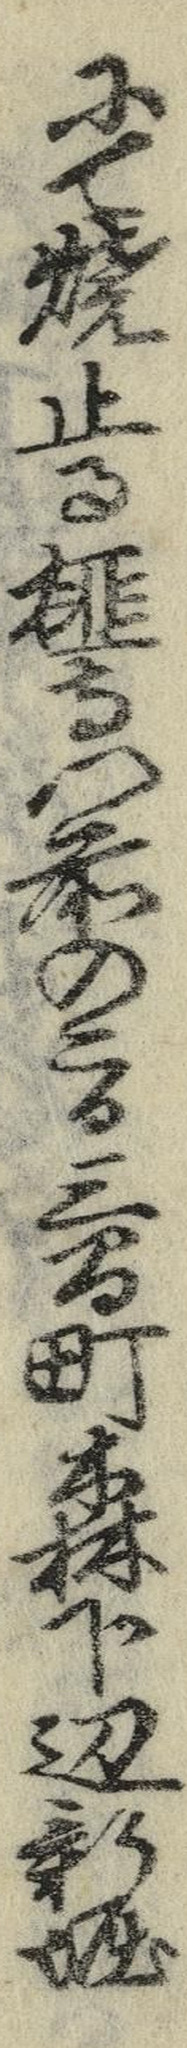にて焼止る榧寺門前のこる三間町森下辺新堀
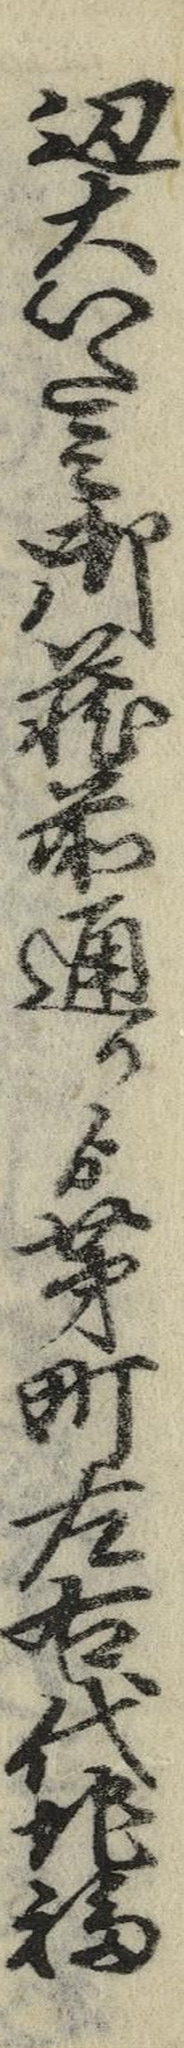辺大いたみ御蔵前通りゟ茅町左右代地福
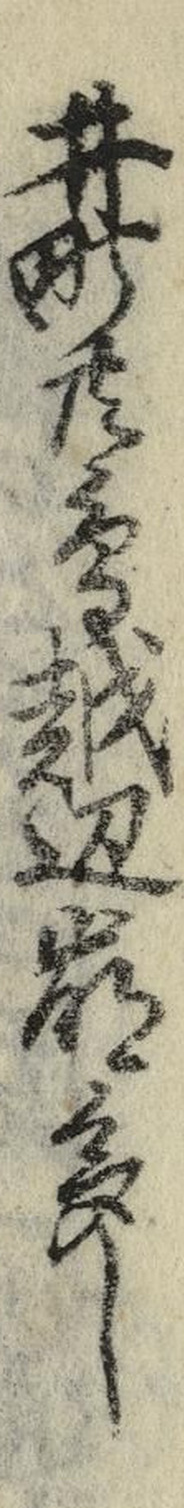井町共鳥越辺崩多し
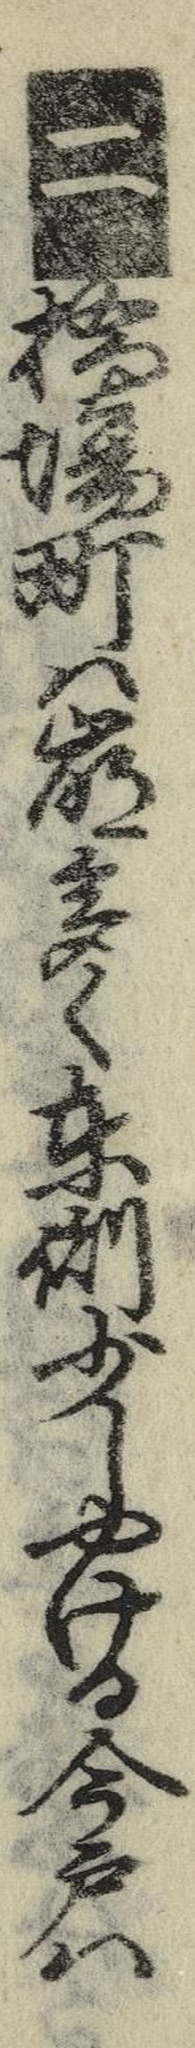二橋場町は崩多く東側少しやける今戸は
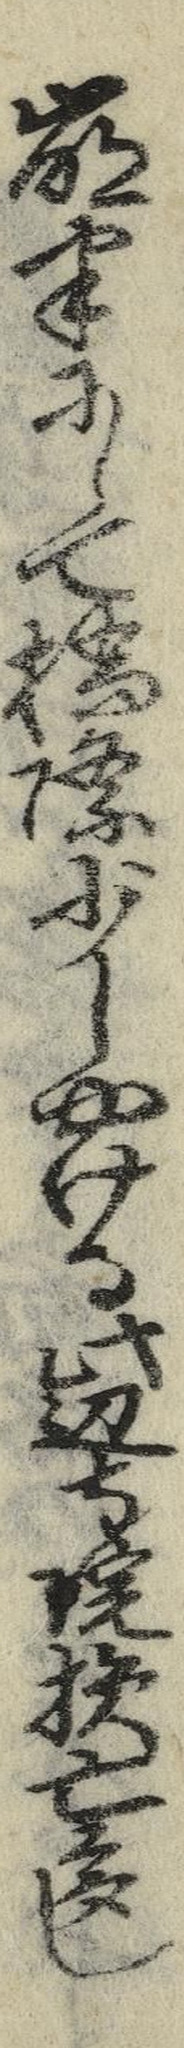崩半にして橋際少しやける此辺寺院損亡多し
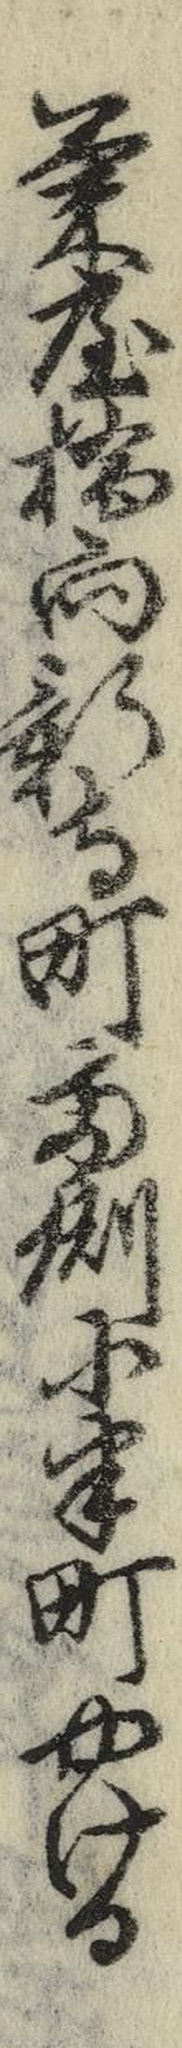菊屋橋向新寺町両側小半町やける
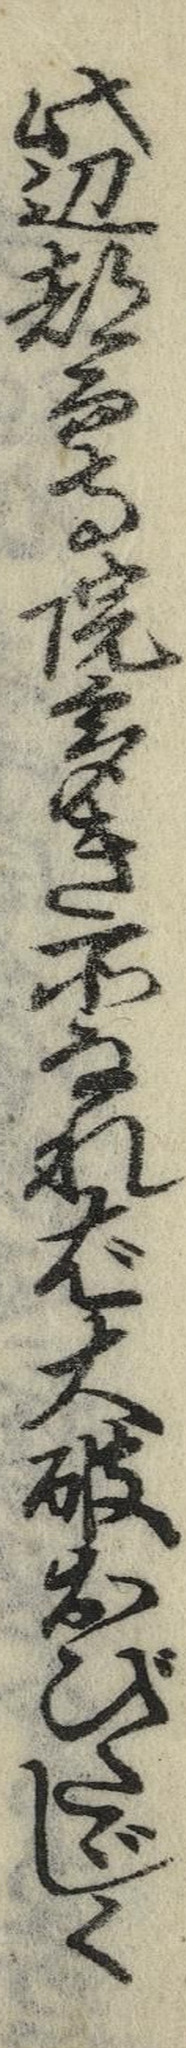此辺都而寺院多き所なれば大破おびたゞしく
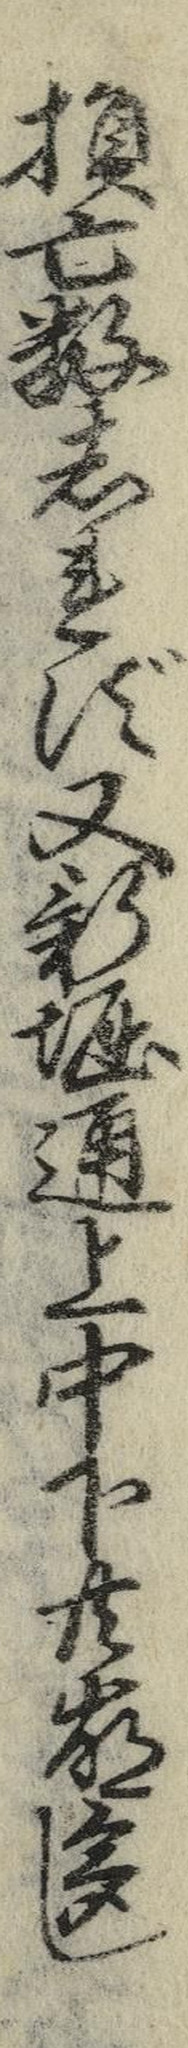損亡数しれず又新堀通上中下共崩多し

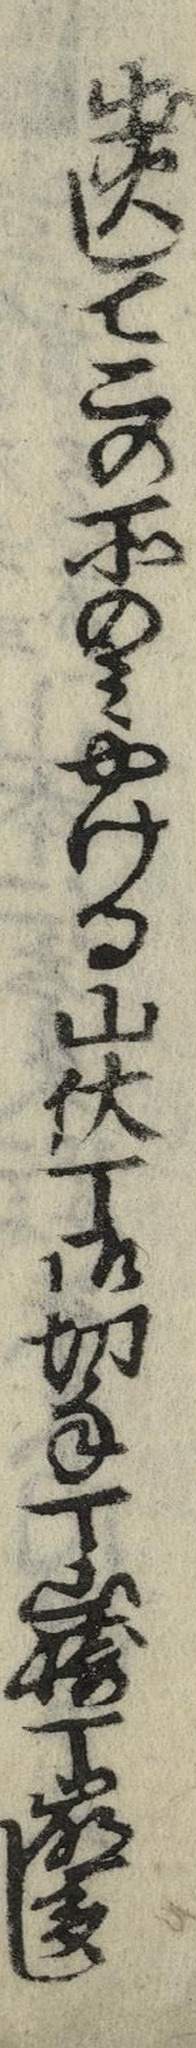出火してこの所のみやける山伏丁御切手丁山崎丁崩多し
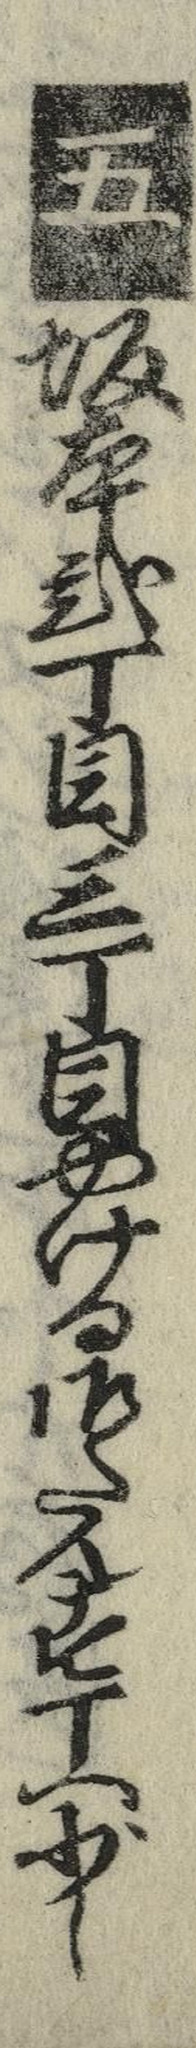五坂本弐丁目三丁目やける御たんす丁は少し
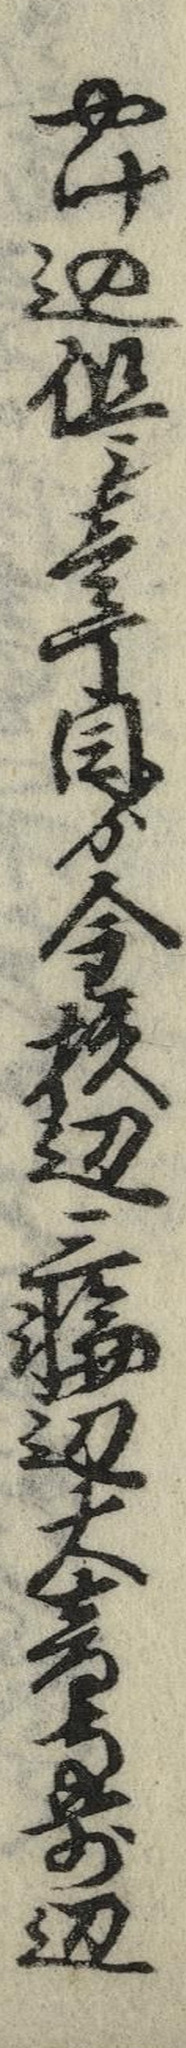やけ込但壱丁目ゟ金杉辺三輪辺大音寺前辺
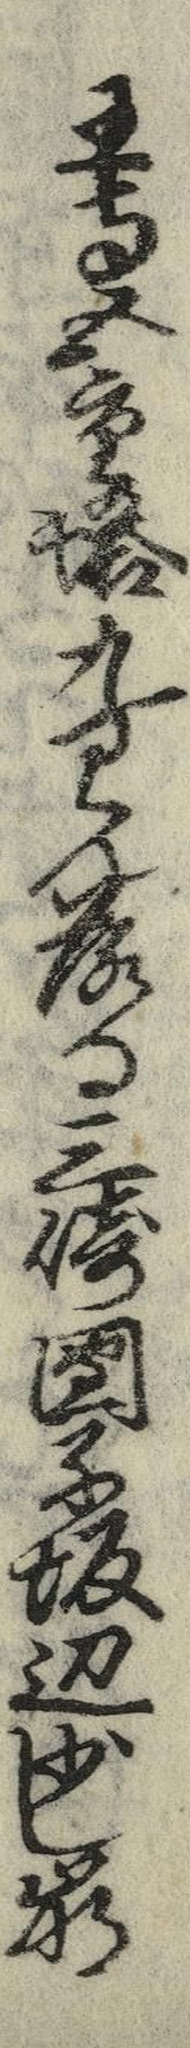王寺五重塔九りん落る三崎団子坂辺少し崩
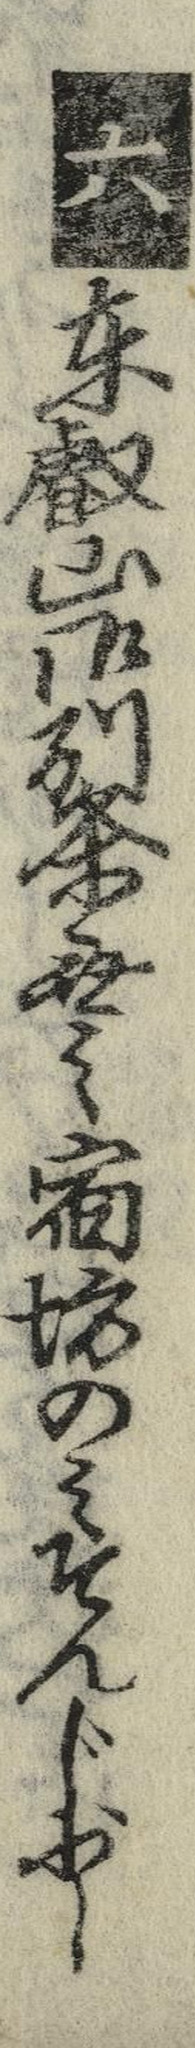六東叡山御別条無之宿坊のみそんじ少々
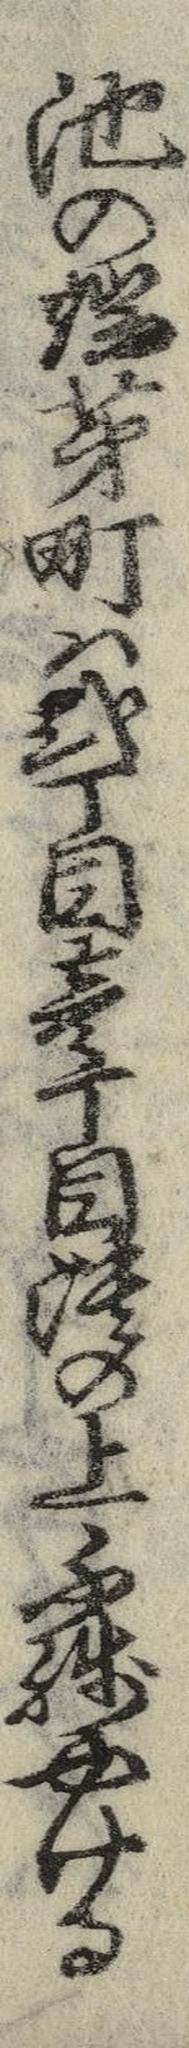池の端茅町は弐丁目壱丁目潰の上不残やける
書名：地震類焼場所明細書之写　安政二卯年十月二日夜四ツ時過　御府内御屋敷方市中共、并街道筋近郷聞書
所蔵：東京大学地震研究所図書室 Earthquake Research Institute Library, The University of Tokyo, JAPAN
